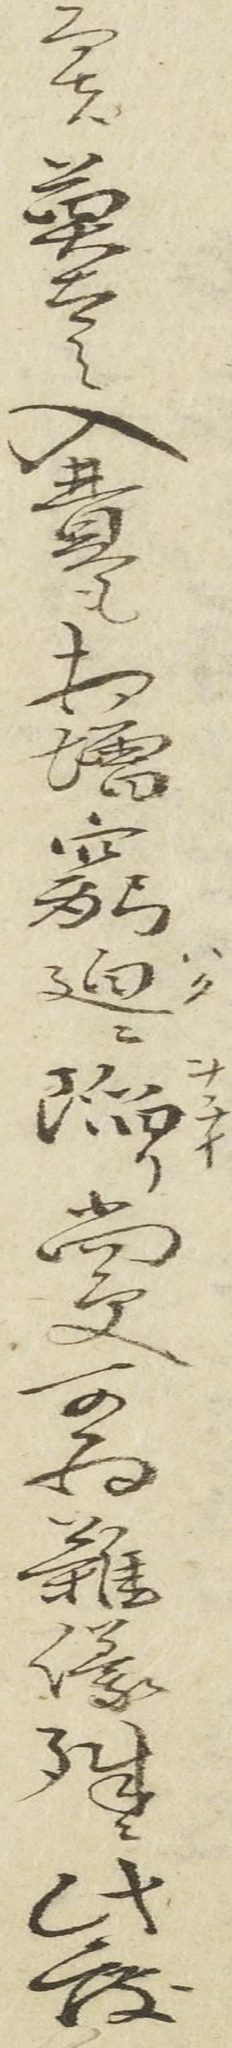而は莫大之入費も相増窮迫ニ陥り尚更可為難儀殊に此度
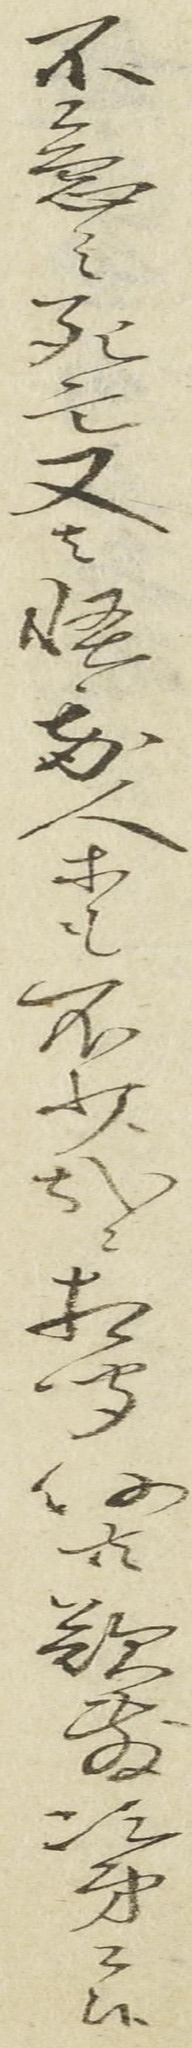不急之死亡又は怪我人等も不少哉ニ相聞何共嘆敷次第ニ候
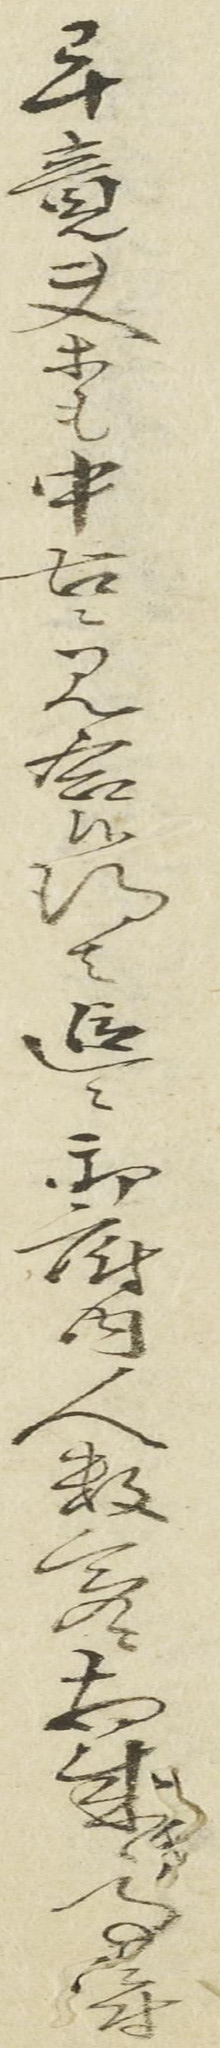畢竟夫等も中古ニ見合候得は追々御府内人数多ニ相成候事ニ付
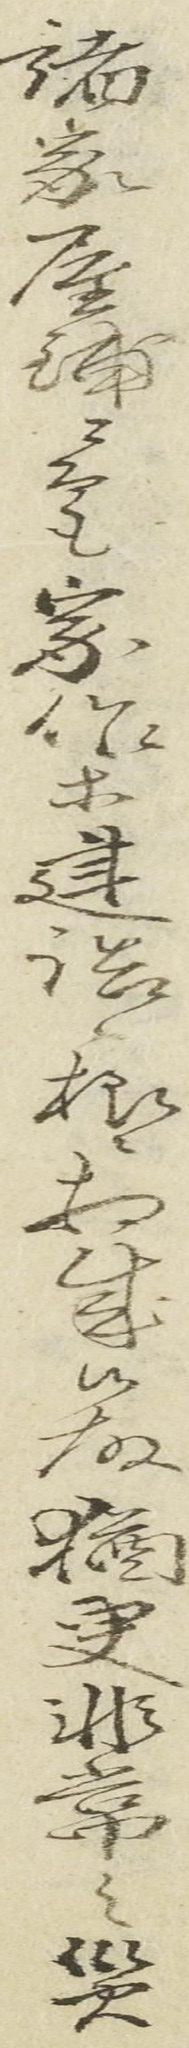諸家屋鋪ニ而も家作等建詰候様ニ相成候故猶更非常之災
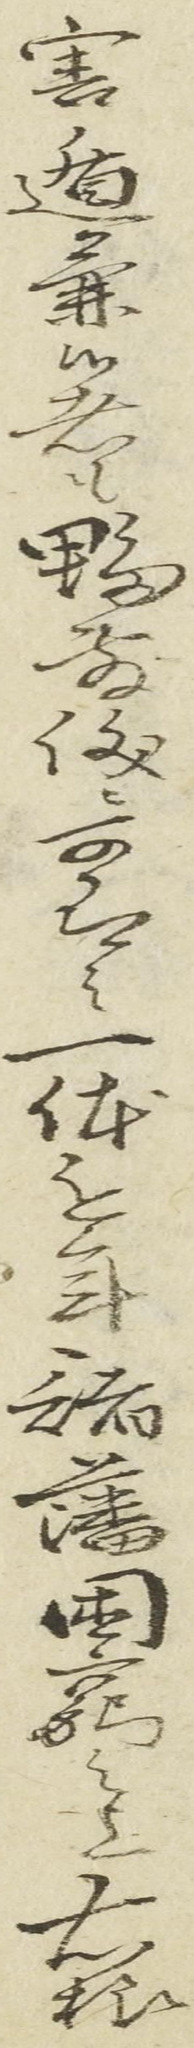害遁兼候者も夥敷儀ニ可有之一体近年諸藩困窮之上右様
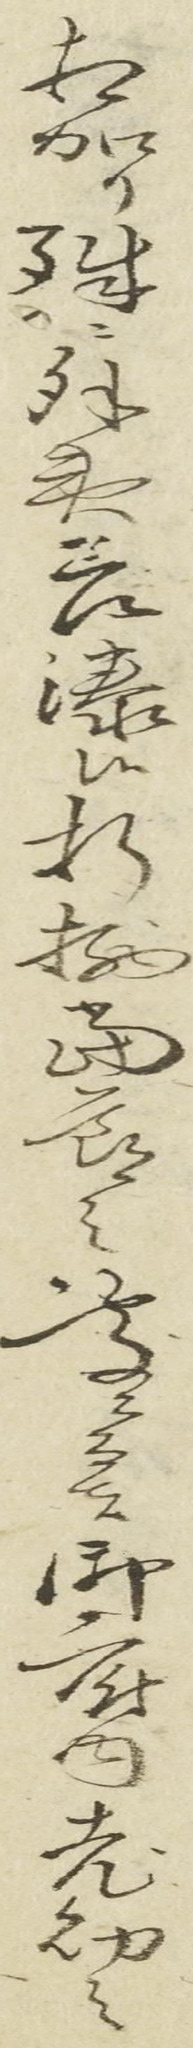相加り殊ニ外夷着湊候折柄当節の噂？ニ而は御府内老幼之
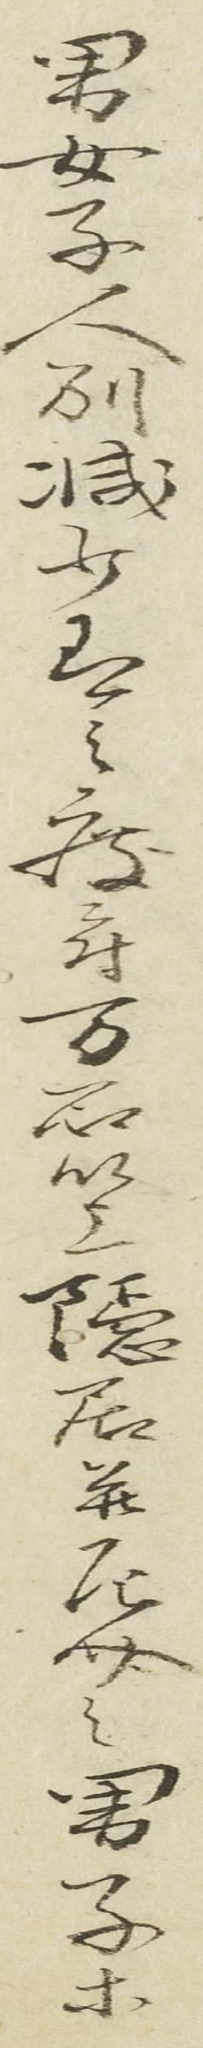男女子人別減少有之度ニ付万石以上隠居幷厄介之男子等
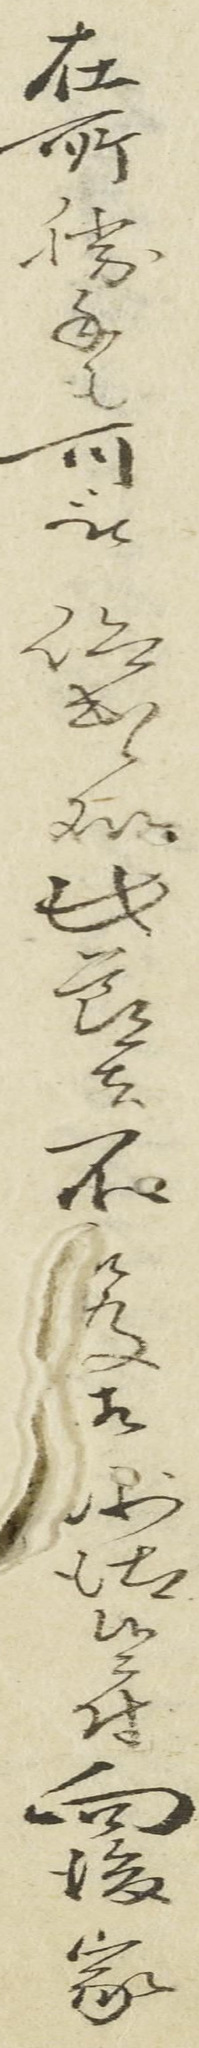在所勝手も可被仰出候処此節は不被及御沙汰候ニ付向後家
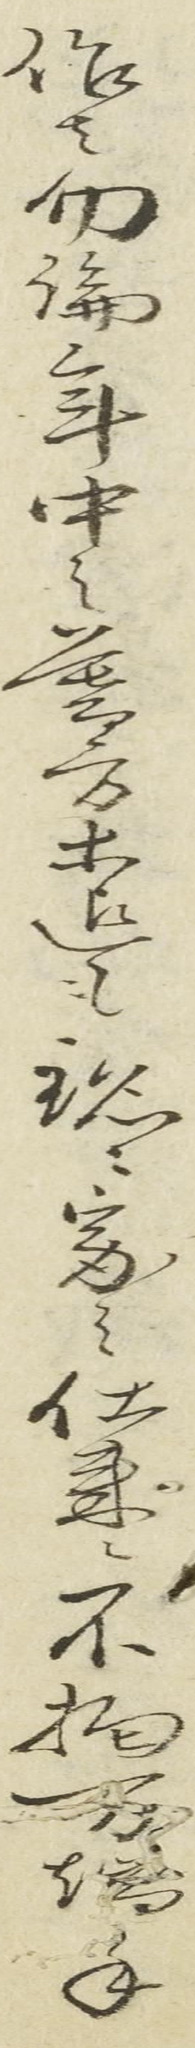作は勿論年中之暮方等迄も銘々家之仕来ニ不拘万端手
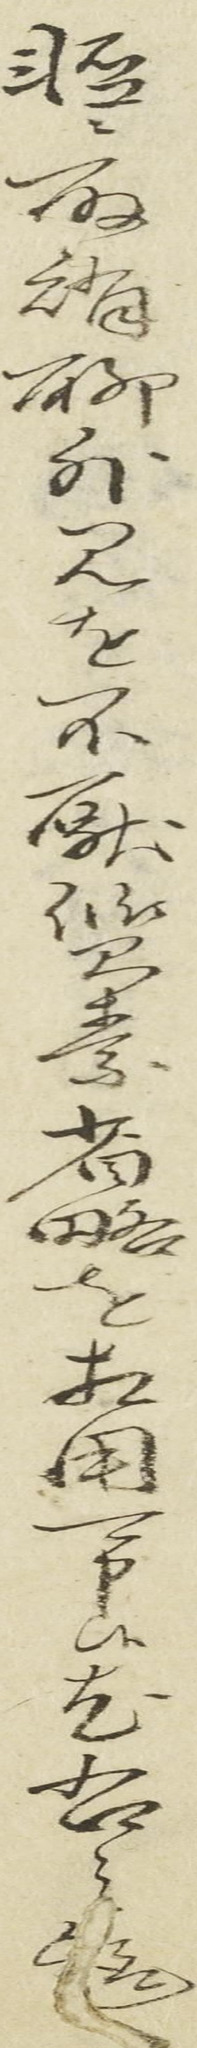軽ニ取賄聊外見を不厭質素省略を相用可申候尤右之趣
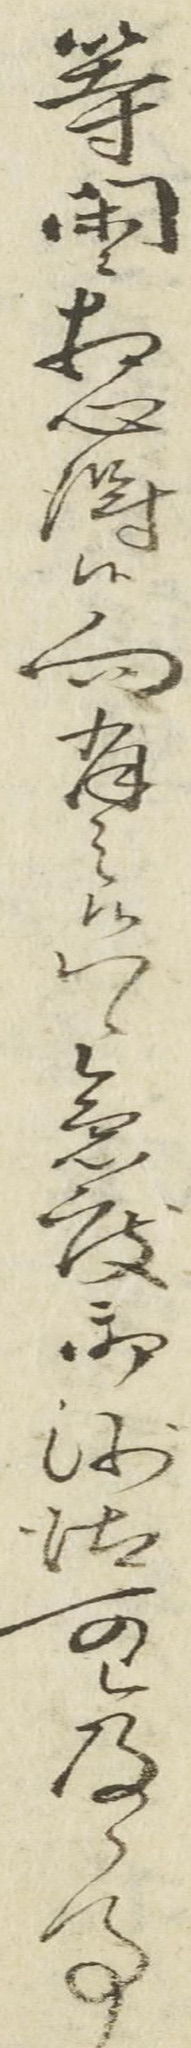等閑ニ相心得候向背之候ハゝ急度御沙汰可被及候事
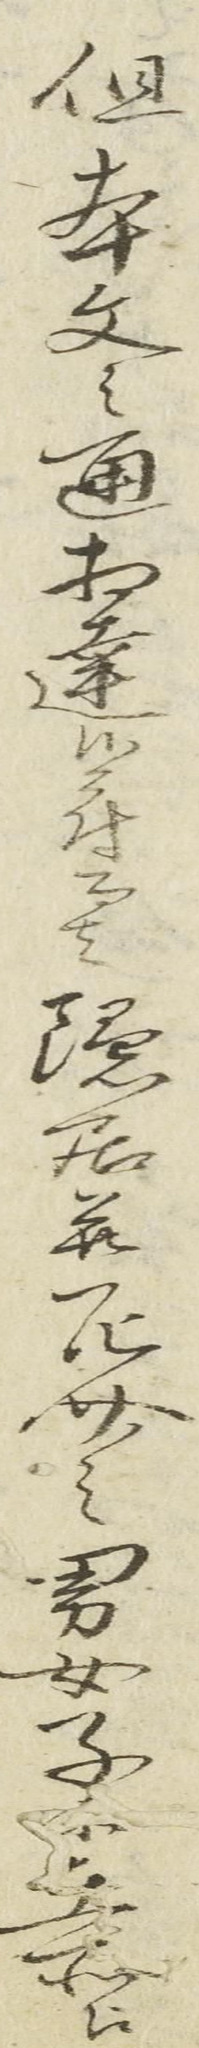但本文之通り相達候ニ付ては隠居幷厄介之男女子ハ在所え
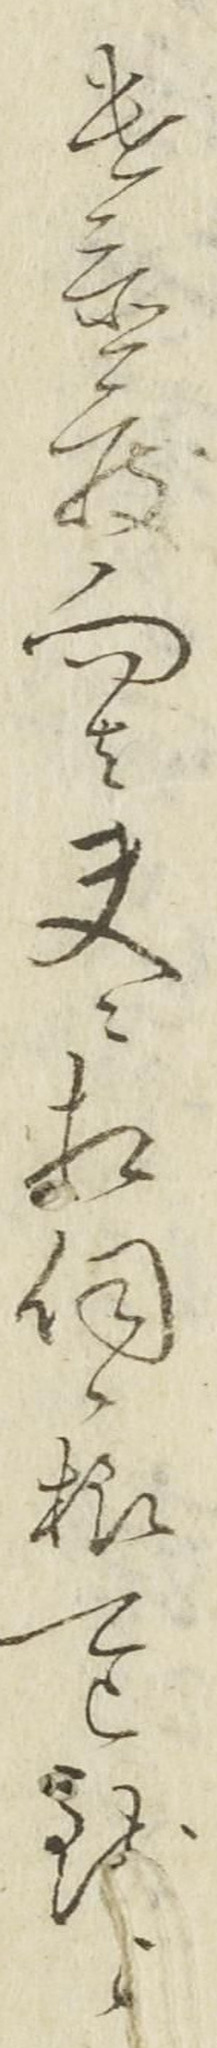遣置度向は夫々相伺候様可被致候
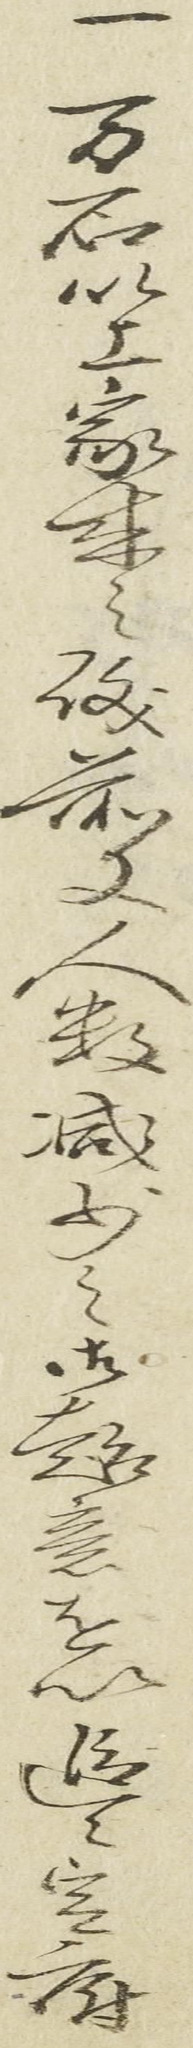一万石以上家来之儀前亦文人数減少之御趣意を以追ゝ定府
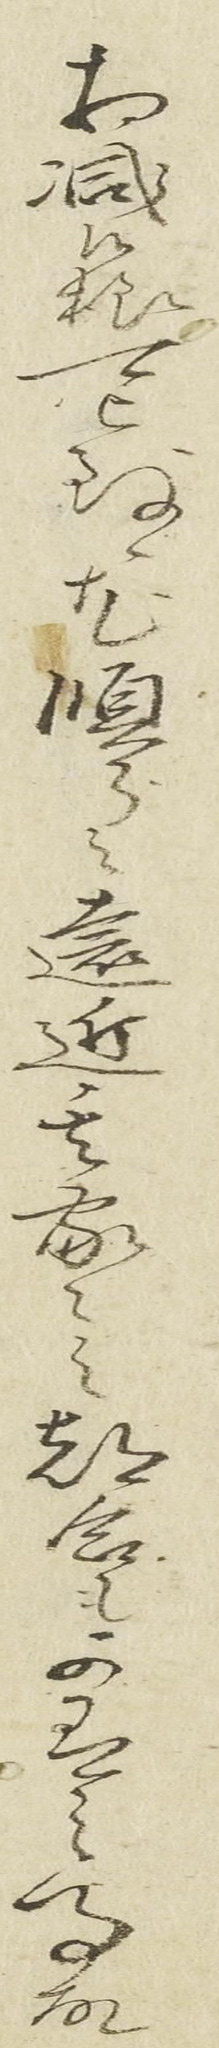相減候様可被致候尤領分之遠近其家々之都合も可有之事故
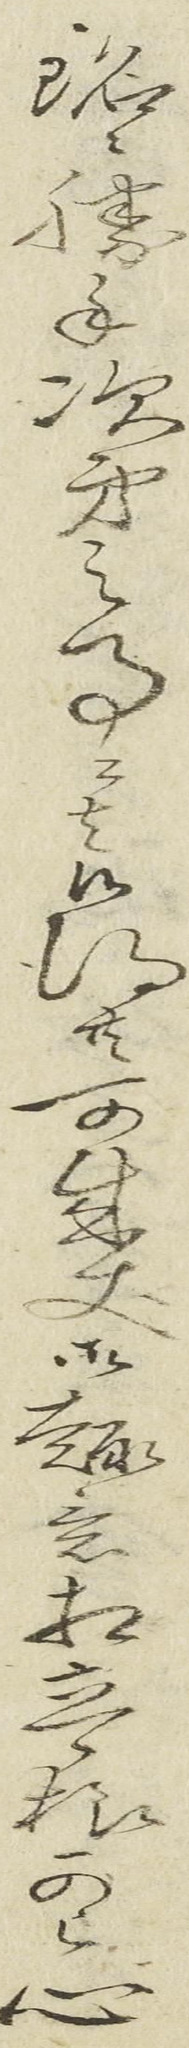銘々勝手次第之事には候得共可成丈御趣意相立候様可被心
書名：安政二乙卯年十月二日大地震之事
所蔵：東京大学地震研究所図書室 Earthquake Research Institute Library, The University of Tokyo, JAPAN
